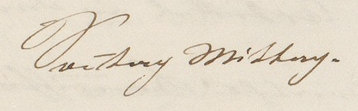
Sonntag Mittag.
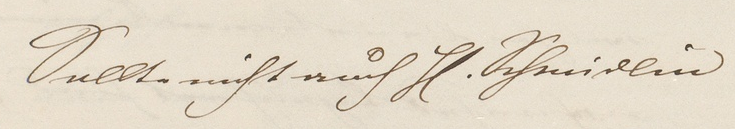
Sollte nicht auch H. Schmidlin
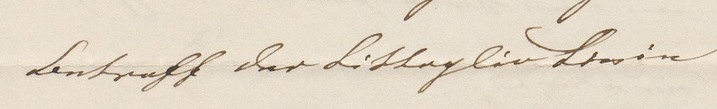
Betreff der Littaglio Linie
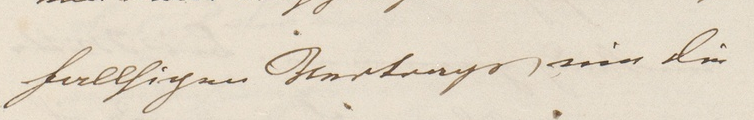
fallsigen Vertrags nie die
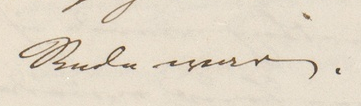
Rede war.
